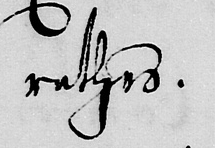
srathes.
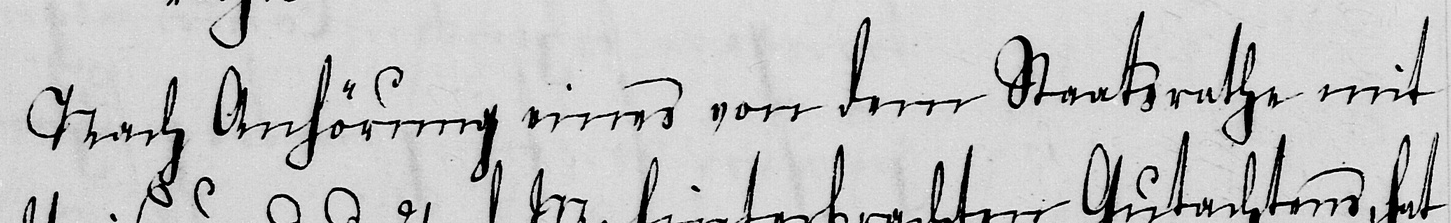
Nach Anhörung eines von dem Staatsrathe mit
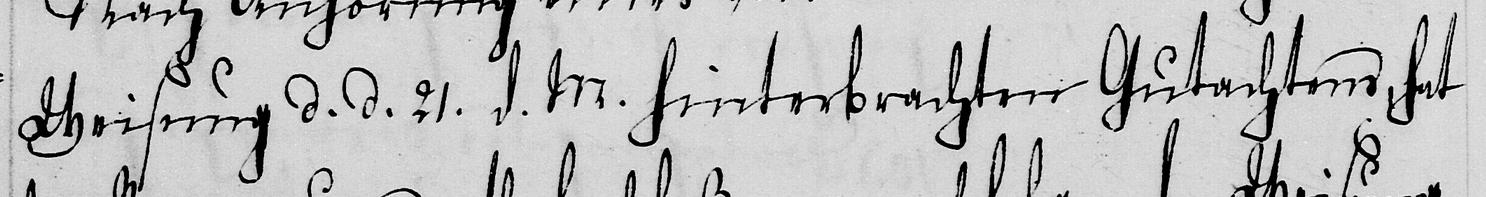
Weisung d. d. 21. d. M. hinterbrachten Gutachtens, hat
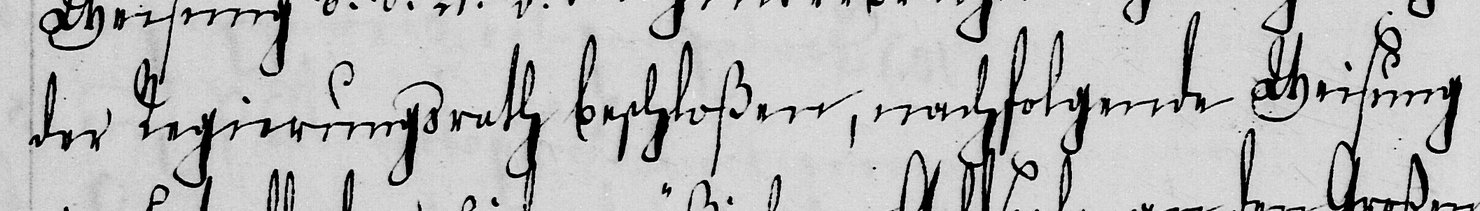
der Regierungsrath beschloßen, nachfolgende Weisung
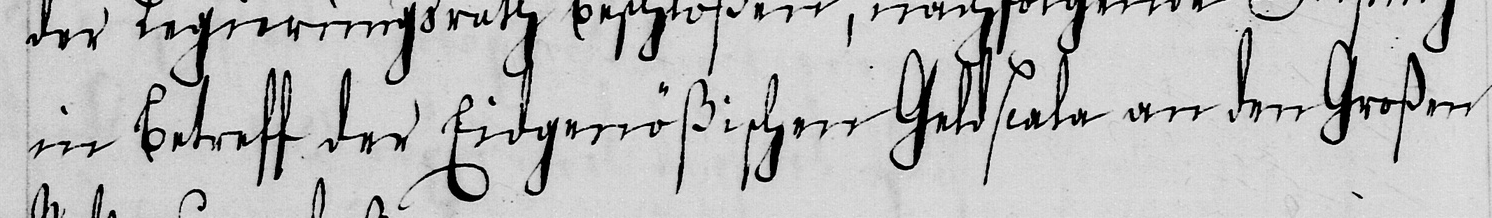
in Betreff der Eidgenößischen Geldscala an den Großen
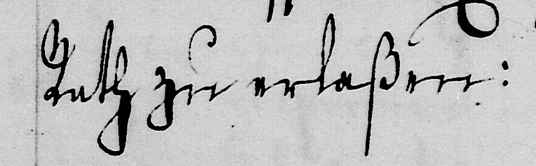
Rath zu erlaßen:
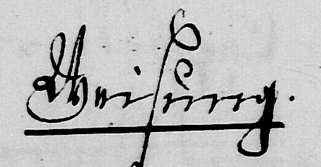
Weisung.
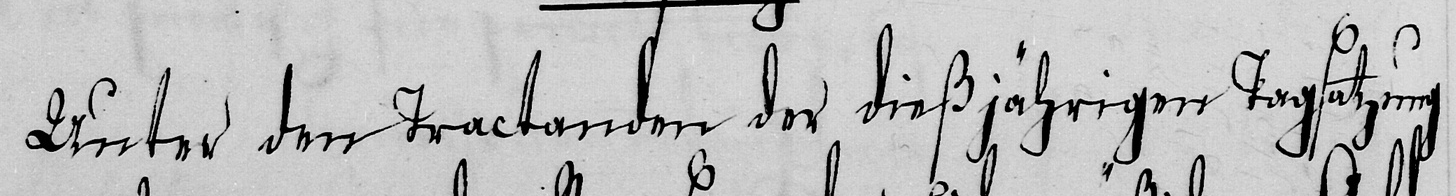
Unter den Tractanden der dießjährigen Tagsatzung
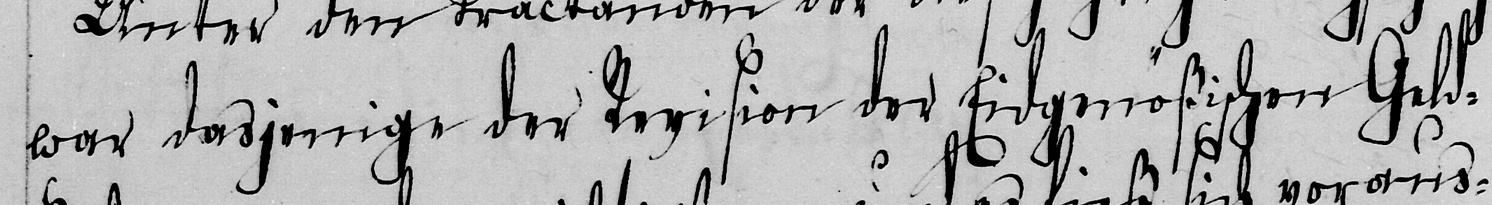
war dasjenige der Revision der Eidgenößischen Geld¬
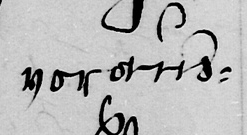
voraus-
